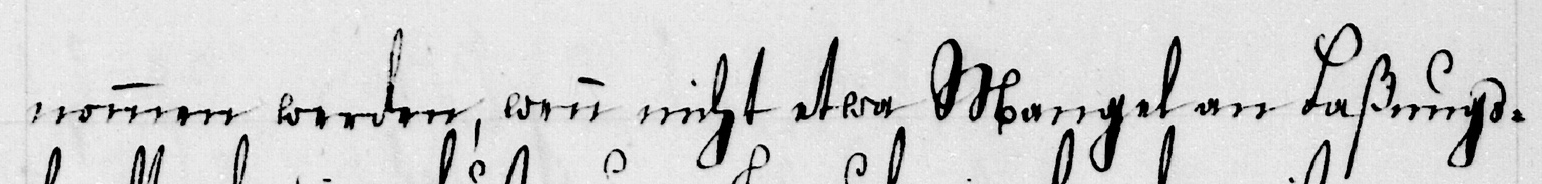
nommen werden, wenn nicht etwa Mangel an Faßungs¬
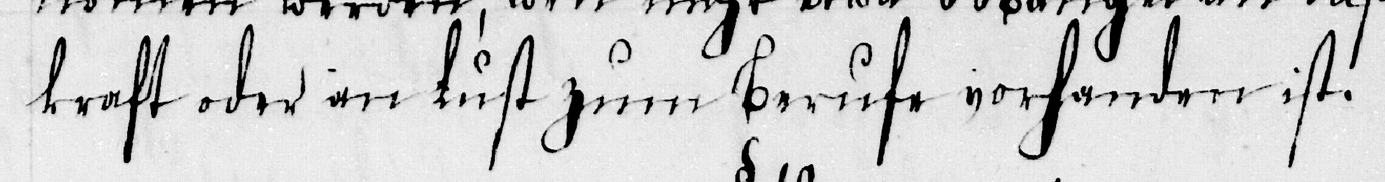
kraft oder an Lust zum Berufe vorhanden ist.
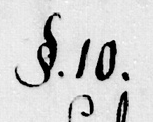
§. 10.
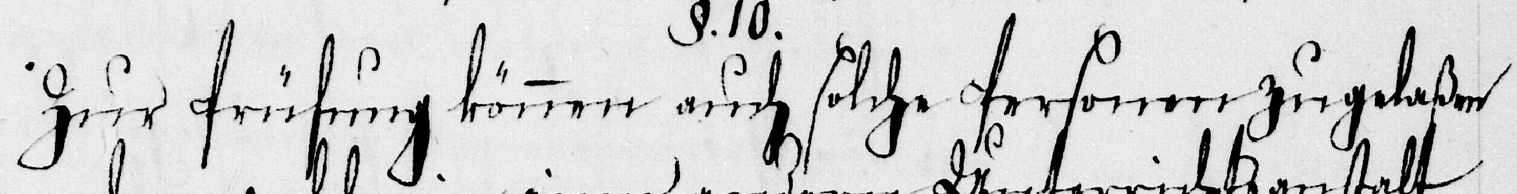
Zur Prüfung können auch solche Personen zugelaßen
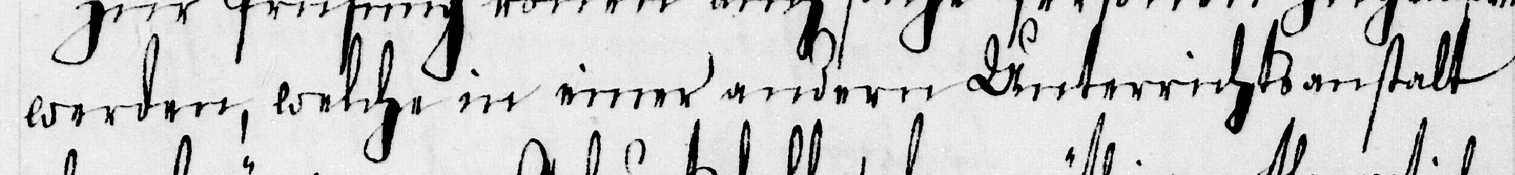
werden, welche in einer andern Unterrichtsanstalt
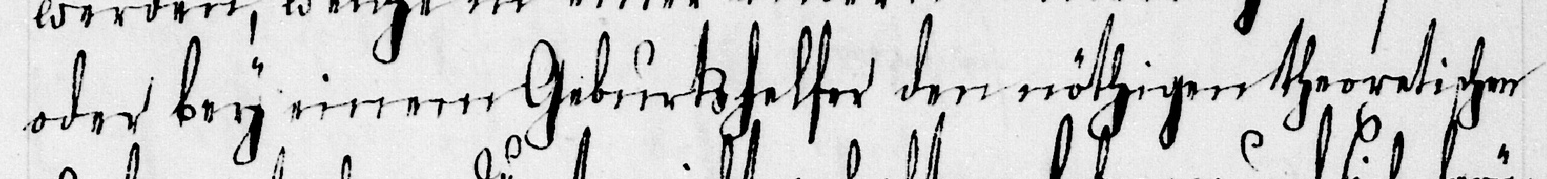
oder bey einem Geburtshelfer den nöthigen theoretischen
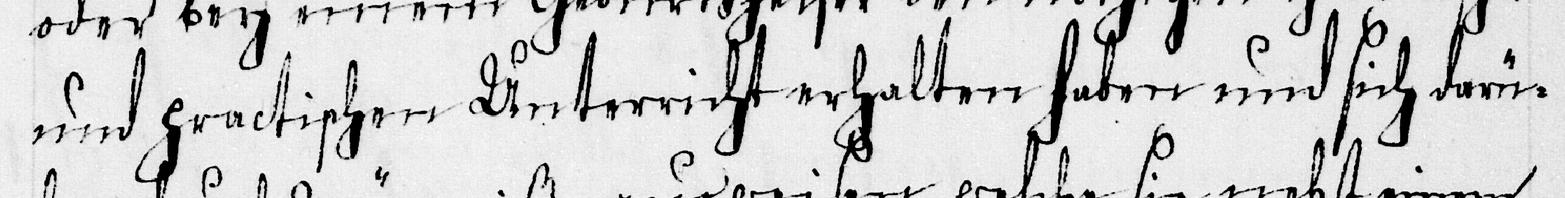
und practischen Unterricht erhalten haben und sich darü¬
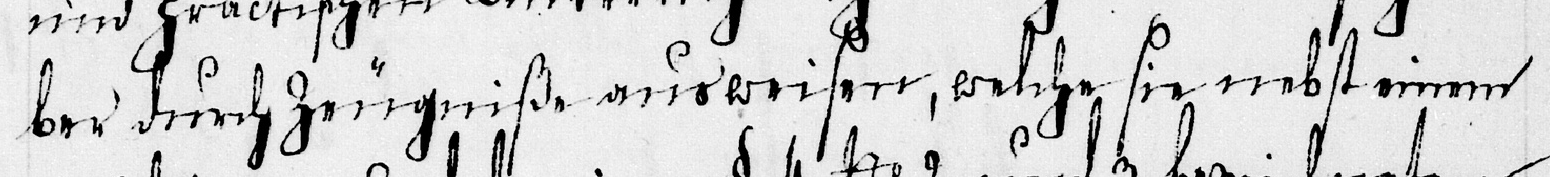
ber durch Zeugniße ausweisen, welche sie nebst einem
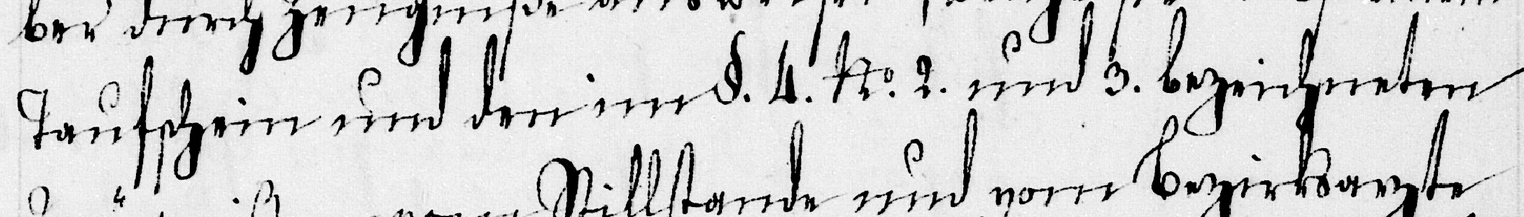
Taufschein und den im §.4. No. 2. und 3. bezeichneten
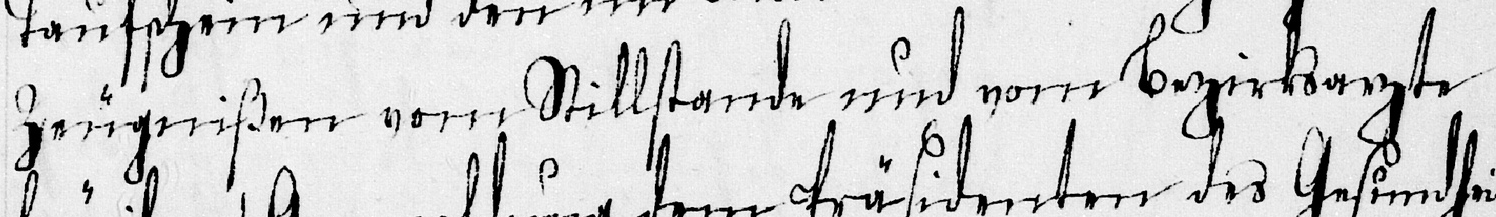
Zeugnißen vom Stillstande und vom Bezirksarzte
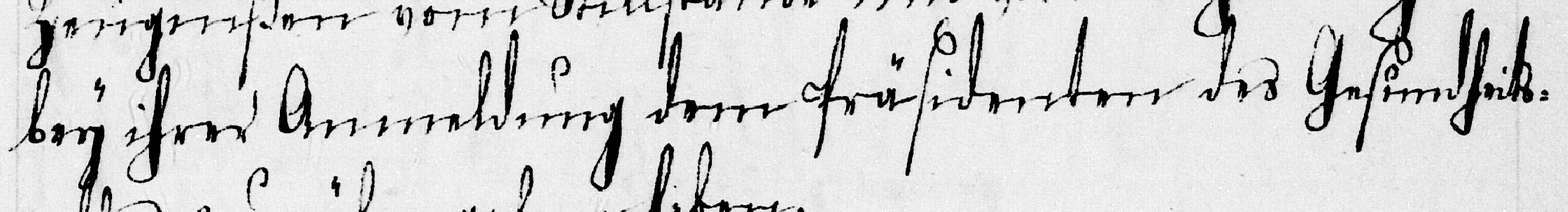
bey ihrer Anmeldung dem Präsidenten des Gesundheit¬
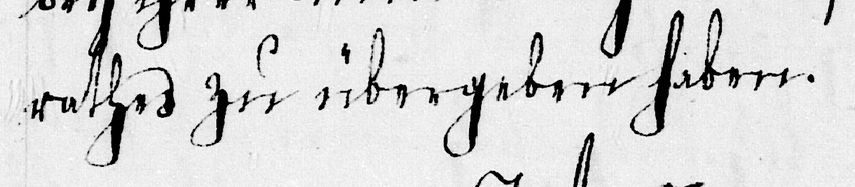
srathes zu übergeben haben.
